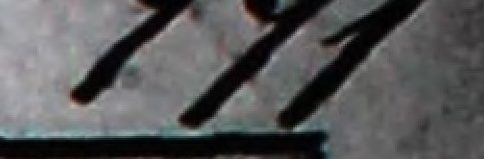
771
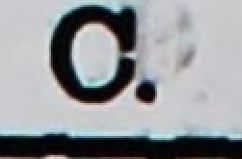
C.
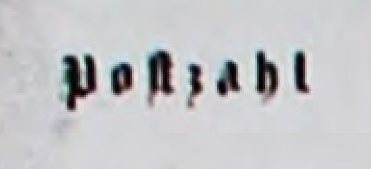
Postzahl
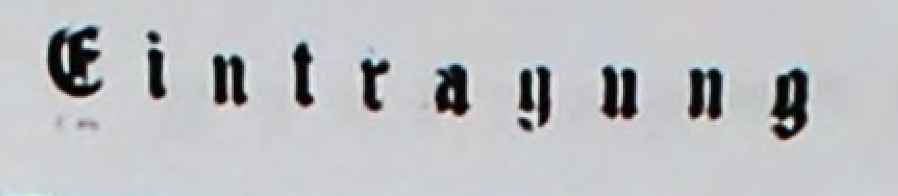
Eintragung
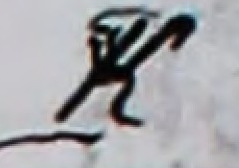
K
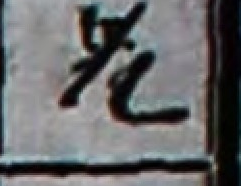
??
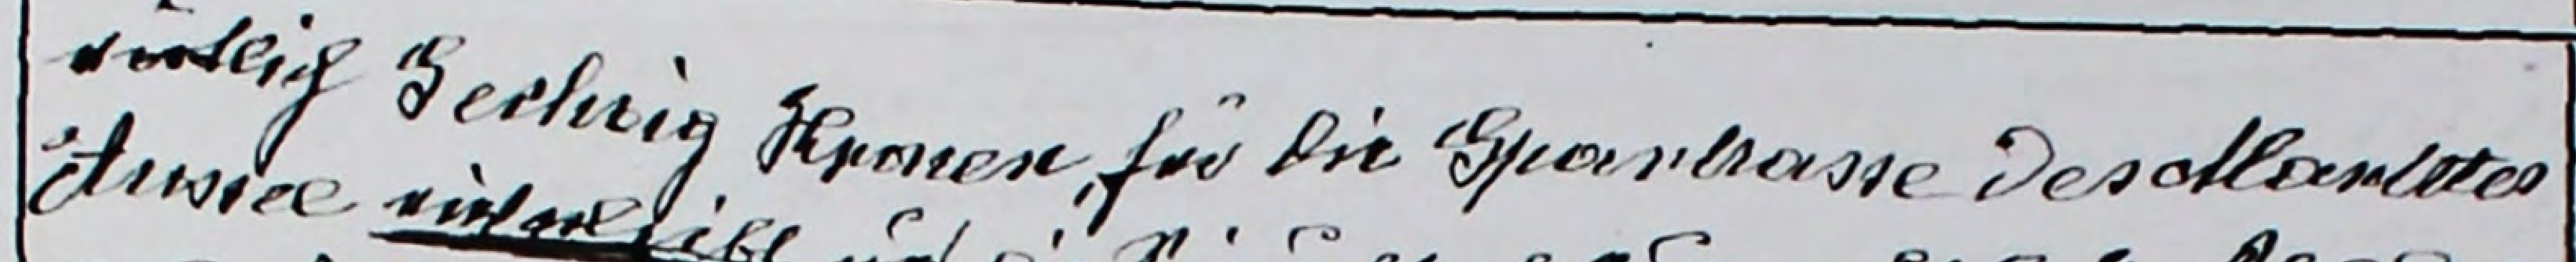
wörtlich Sechzig Kronen, für die Sparkasse des Marktes
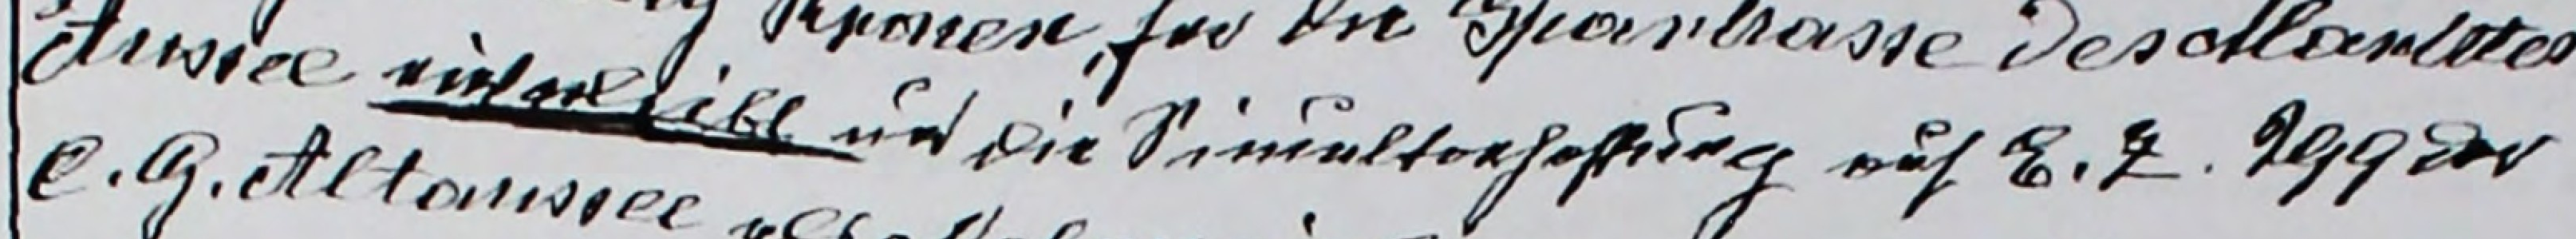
Aussee einverleibt und die Simultanhaftung auf E.Z. 299 der
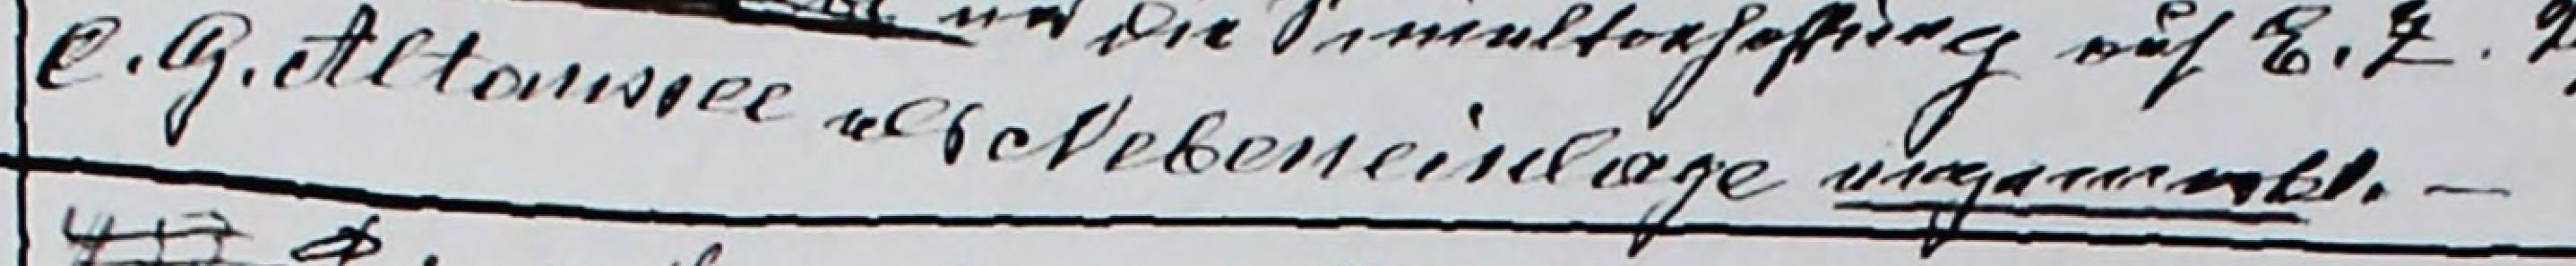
C.G. Altaussee als Nebeneinlage angemerkt.-
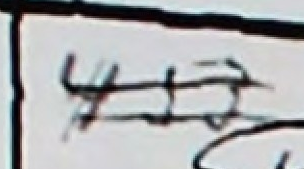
453
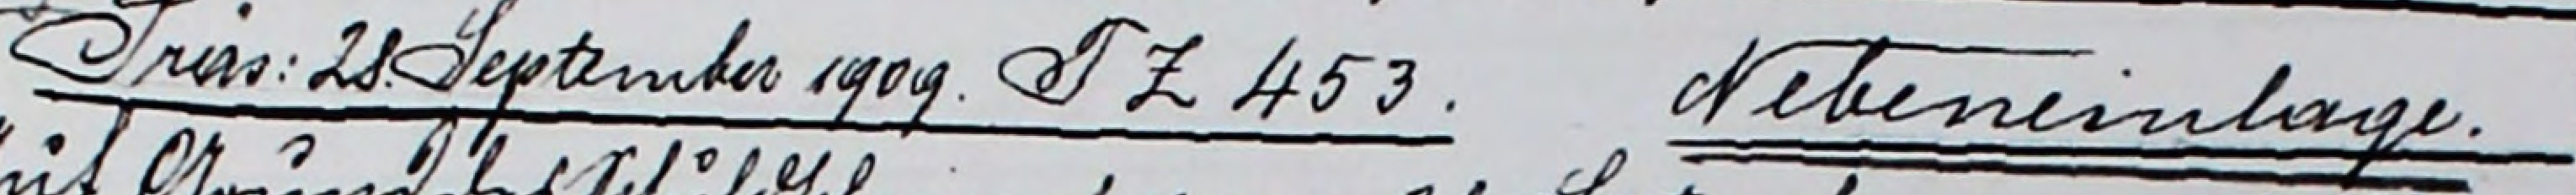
Präs: 28. September 1909. T Z 453. Nebeneinlage.
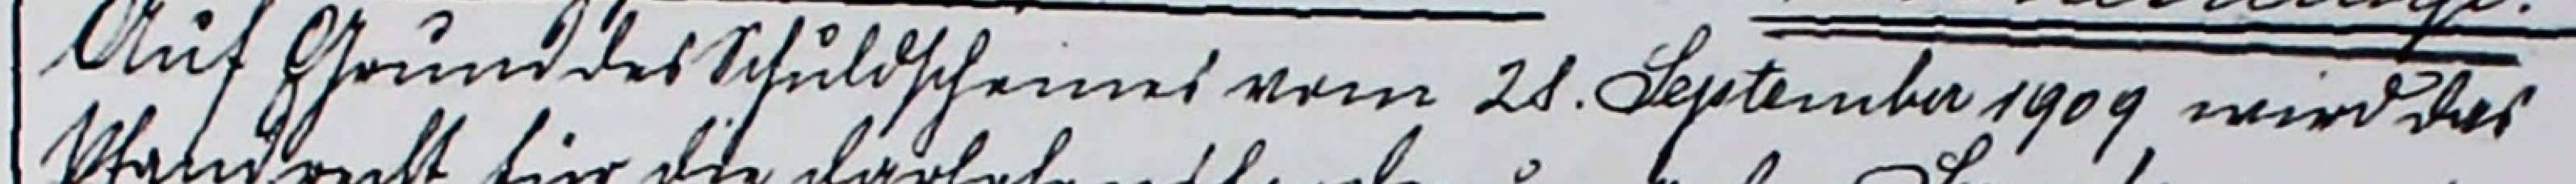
Auf Grund des Schuldscheines vom 28. September 1909 wird das
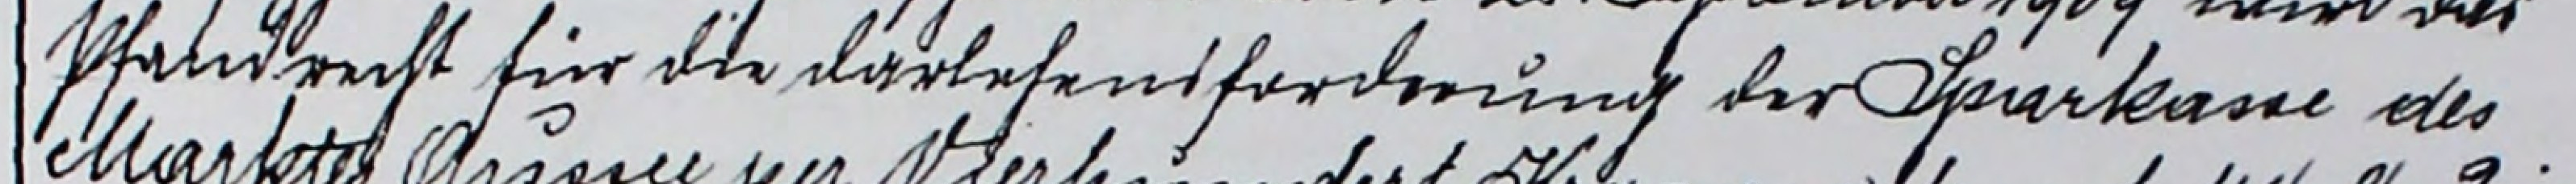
Pfandrecht für die Darlehensforderung der Sparkasse des
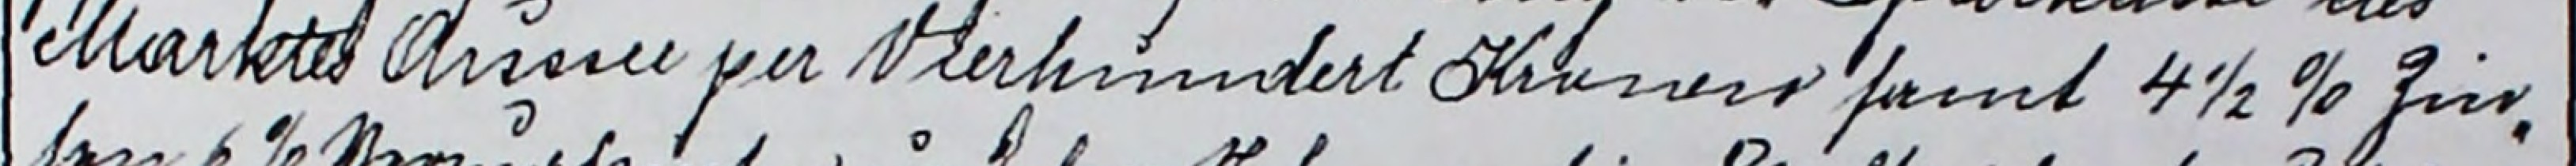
Marktes Aussee per Vierhundert Kronen samt 4 1/2 % Zin„
